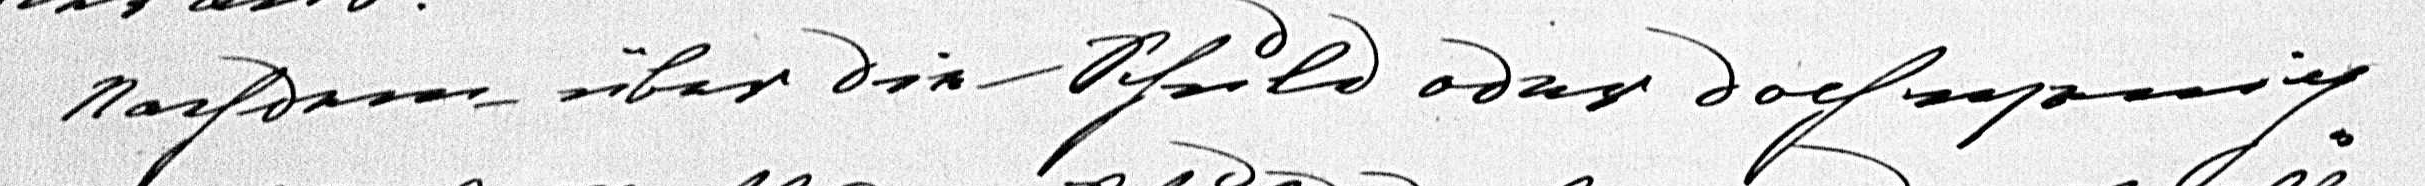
Nachdem über die Schuld oder doch wenig¬
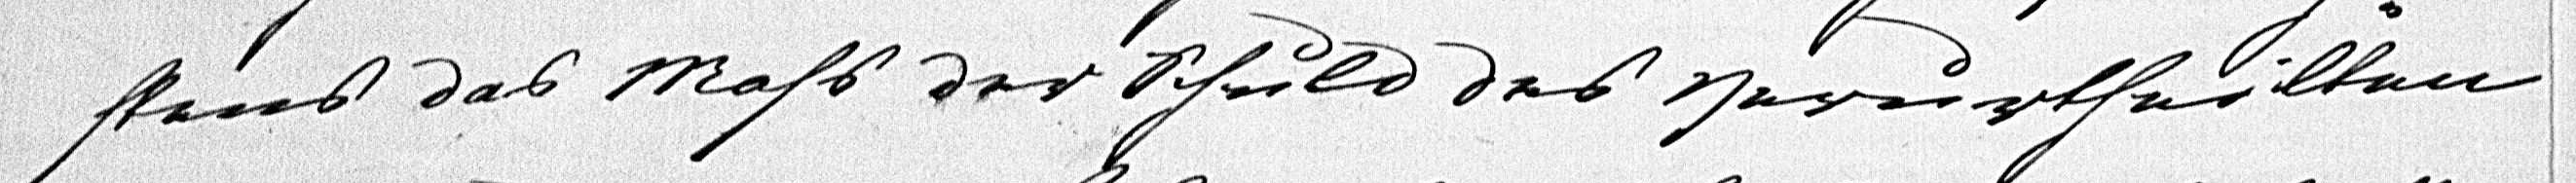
stens das Mass der Schuld des Verurtheilten
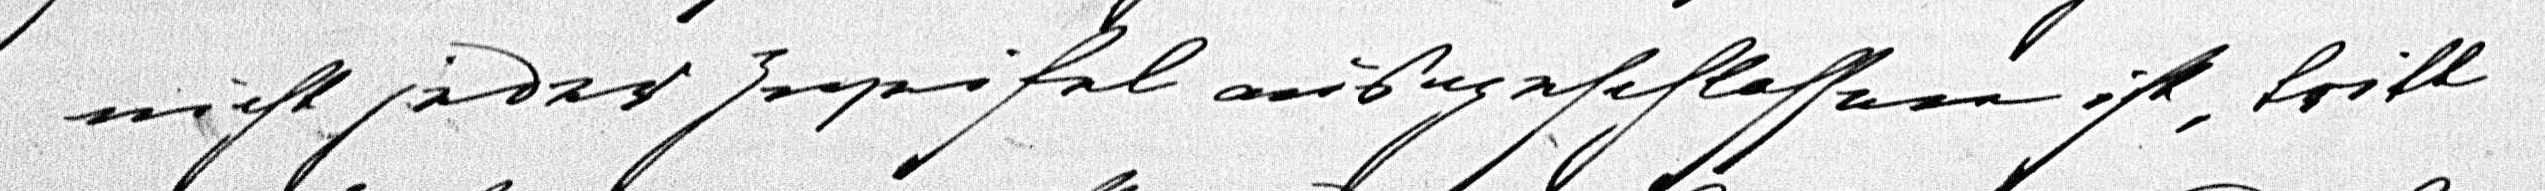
nicht jeder Zweifel ausgeschlossen ist, tritt
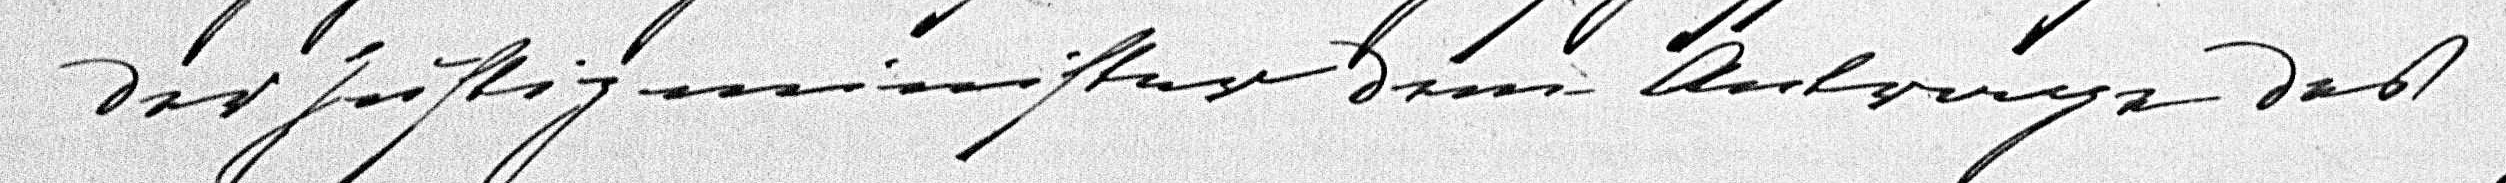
der Justizminister dem Antrage des
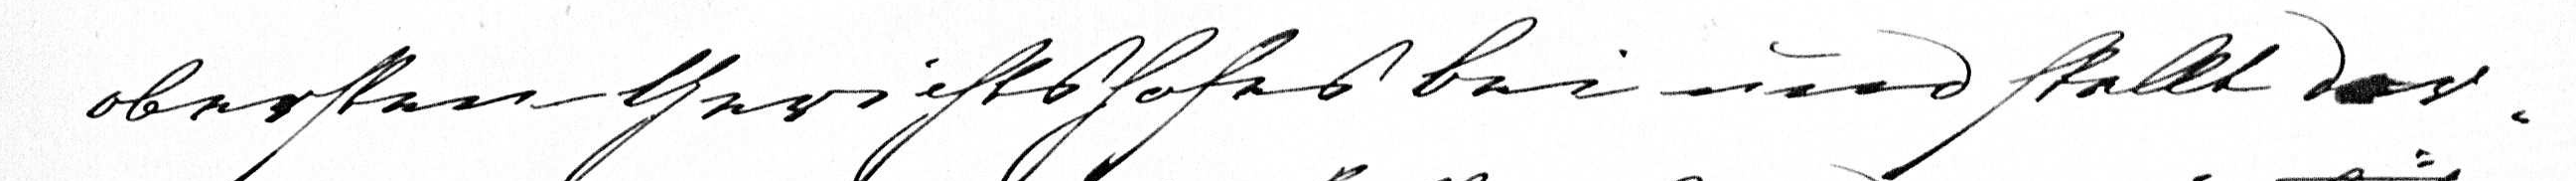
obersten Gerichtshofes bei und stellt der¬
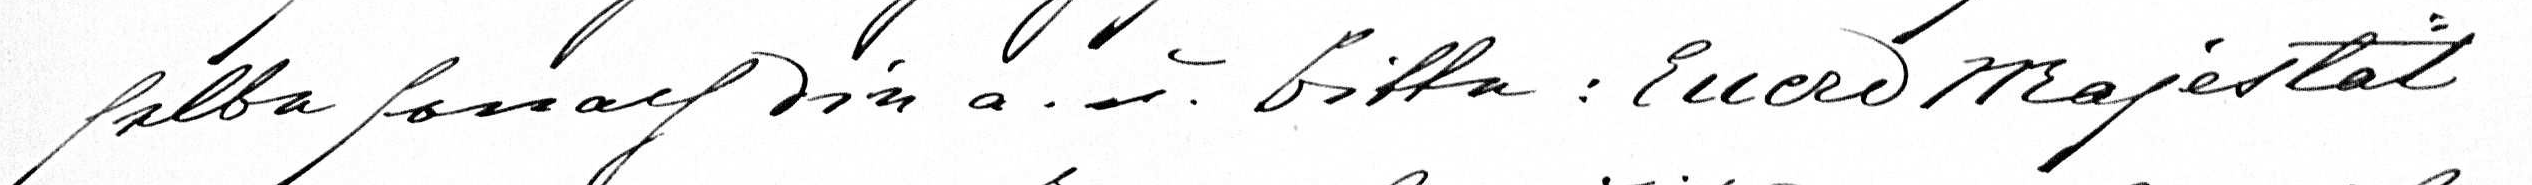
selbe sonach die a. u. Bitte: Euerd Majestät
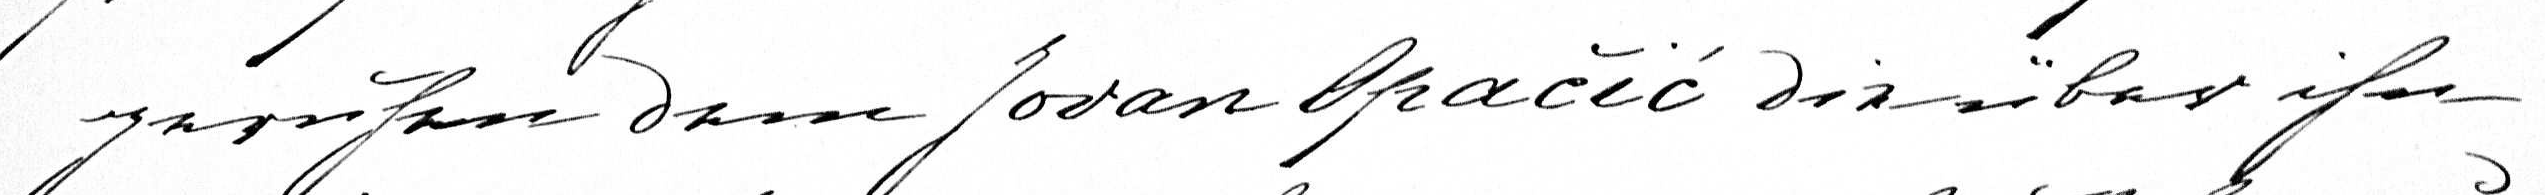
geruhen dem Jovan Opačić die über ihn
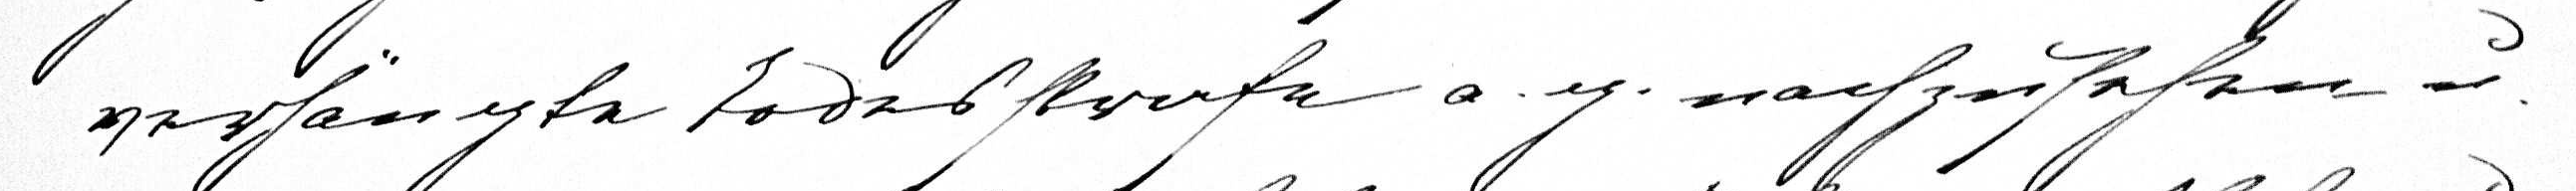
verhängte Todesstrafe a. g. nachzusehen u.
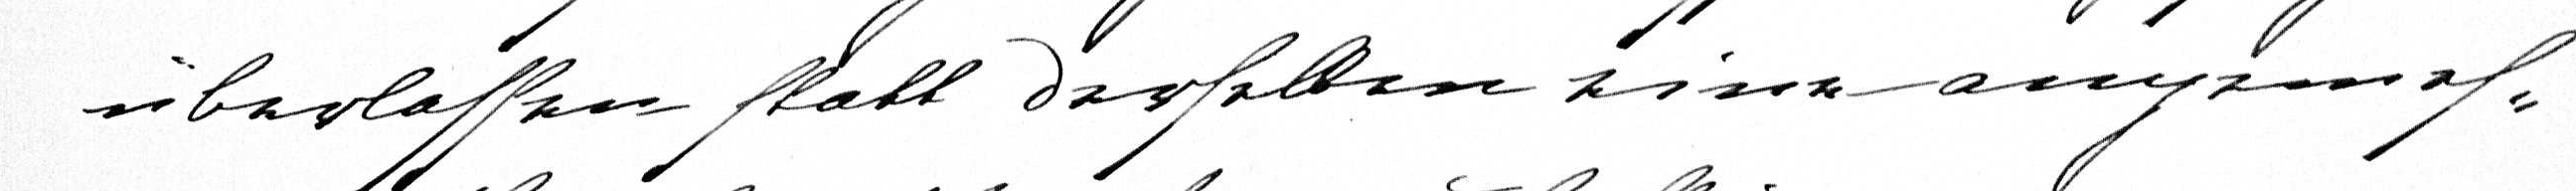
überlassen statt derselben eine angemes¬
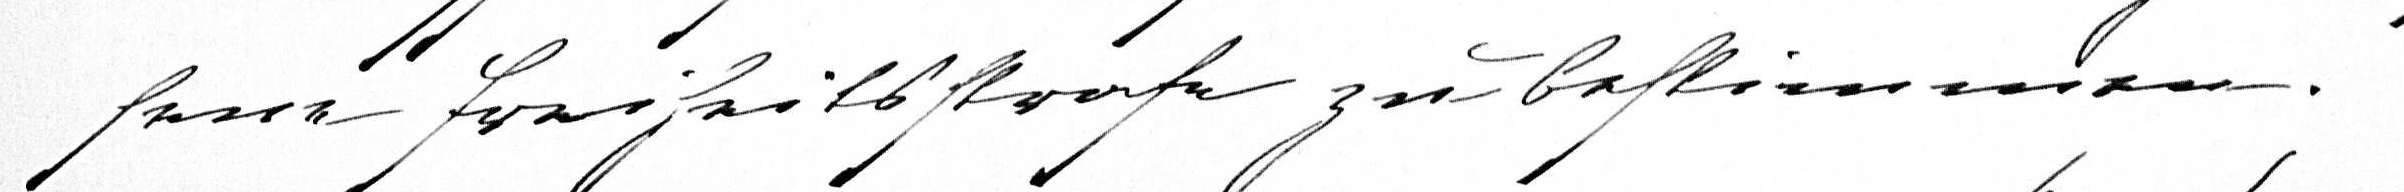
sene Freiheitsstrafe zu bestimmen.
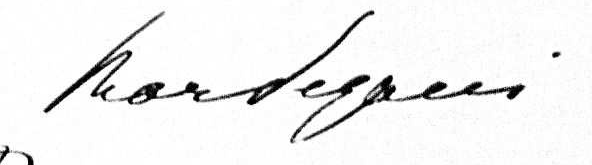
Mordexx
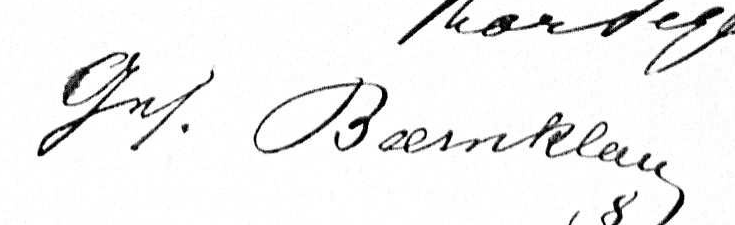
Ges. Boernklau
